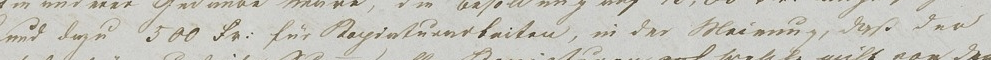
und dazu 500 Fr: für Kopiaturarbeiten, in der Meinung, daß der
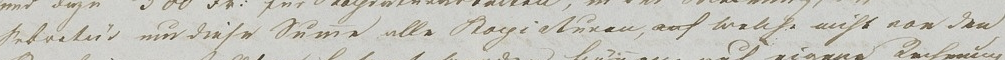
Sekretär um diese Summe alle Kopiaturen, auf welche nicht von den
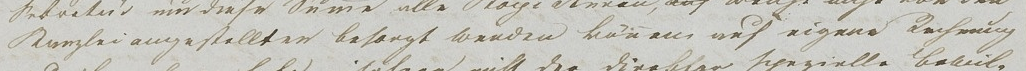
Kanzleiangestellten besorgt werden können auf eigene Rechnung
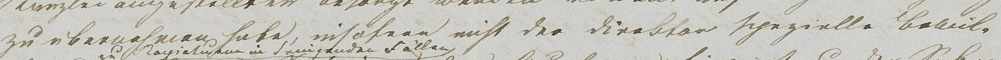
zu übernehmen habe, insofern nicht der Direktor spezielle Bewil-
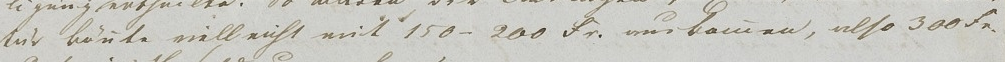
tär könnte vielleicht mit 150–200 Fr. auskommen, also 300 Fr.
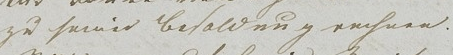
zu seiner Besoldung rechnen.
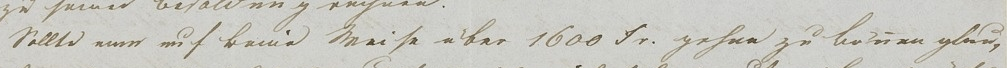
Sollte man auf keine Weise über 1600 Fr. gehen zu können glau-
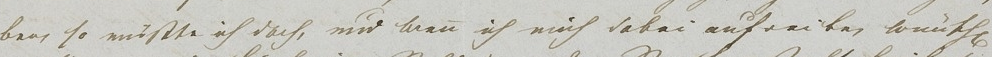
ben, so müßte ich doch, und wenn ich mich dabei aufreibe, wünschen
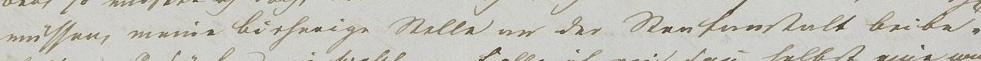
müssen meine bisherige Stelle an der Strafanstalt beibe-
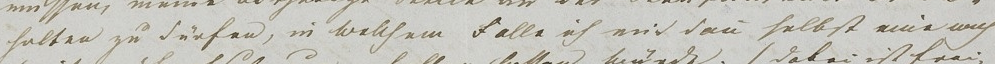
halten zu dürfen, in welchem Falle ich mir dann selbst eine noch
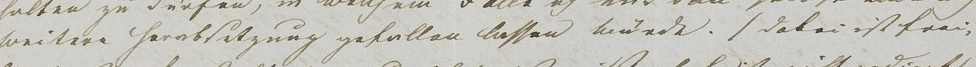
weitere Herabsetzung gefallen lassen würde. (Dabei ist frei-
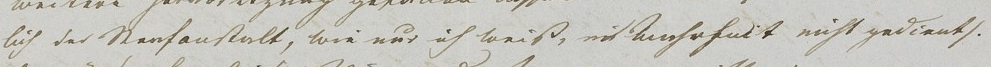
lich der Strafanstalt, wie nur ich weiß, in Wahrheit nicht gedient).
